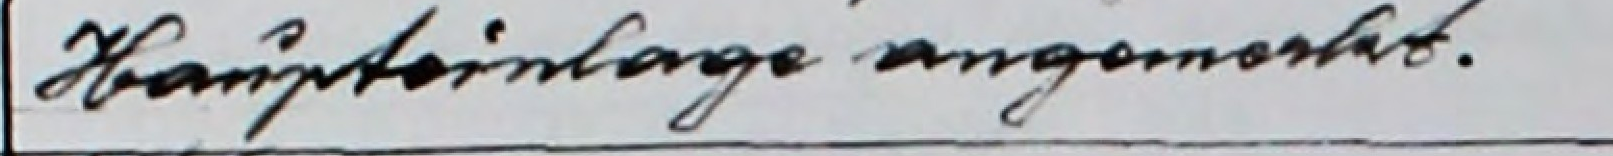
Haupteinlage angemerkt.
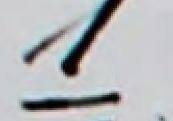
1
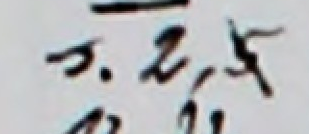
s. 2, 5
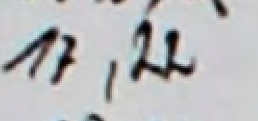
17, 22
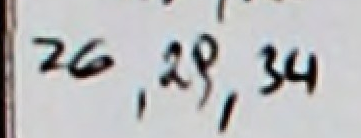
26, 29, 34
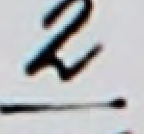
2
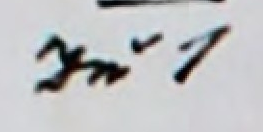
Zu 1
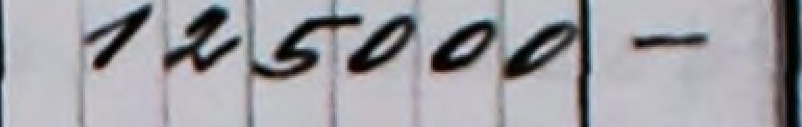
12500
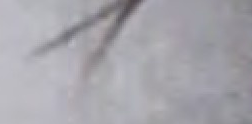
1
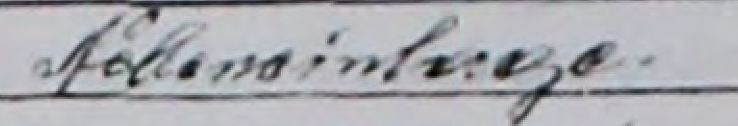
Nebeneinlage
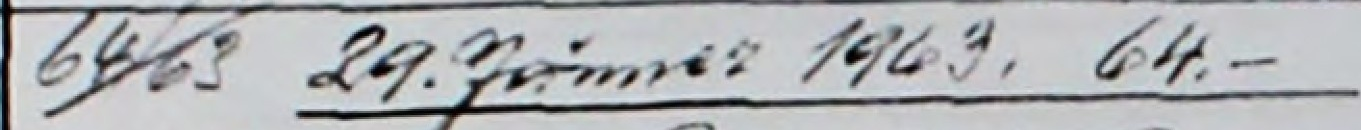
64/63 29. Jänner 1963, 64.-
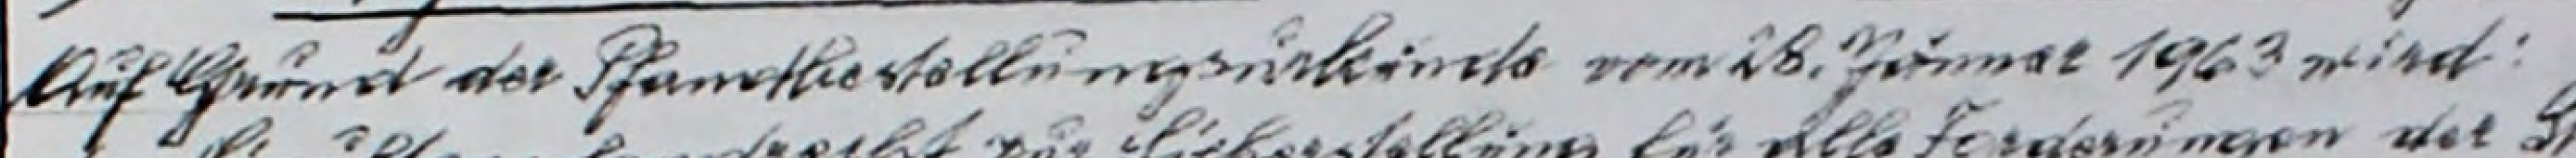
Auf Grund der Pfandbestellungsurkunde vom 28. Jänner 1963 wird:
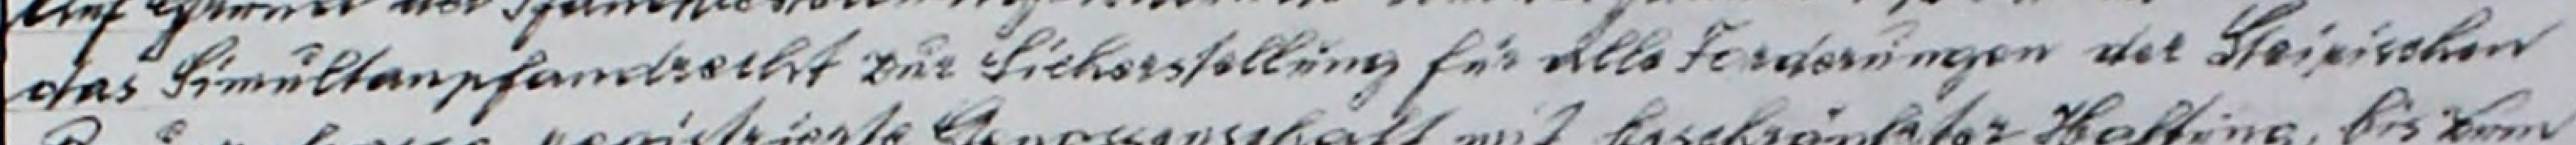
das Simultanpfandrecht zur Sicherstellung für alls Forderungen der Steirischen
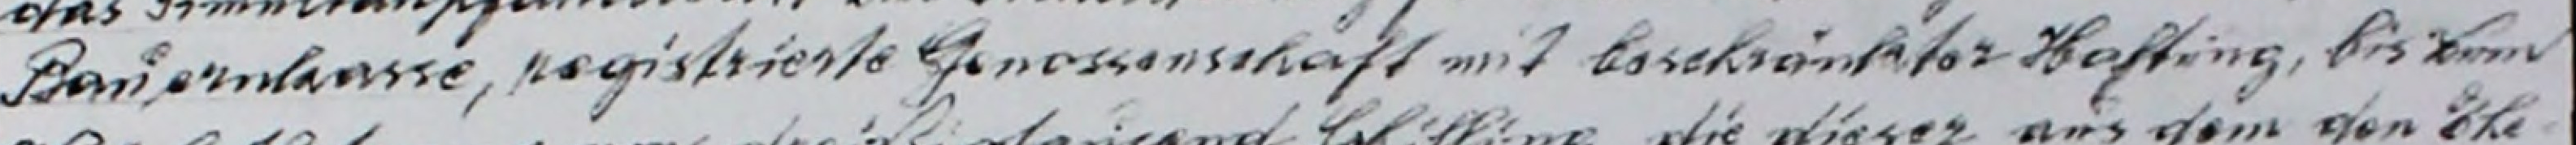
Bauernhasse, registrierte Genossenschaft mit beschränkter Haftung, bis Bren
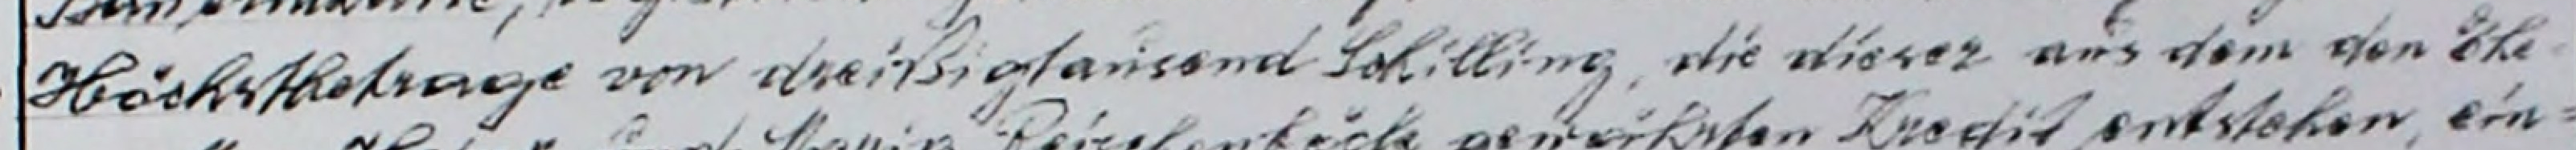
Höchstbetrage von dreißigtausend Schilling, die dieser aus dem den Ehe=
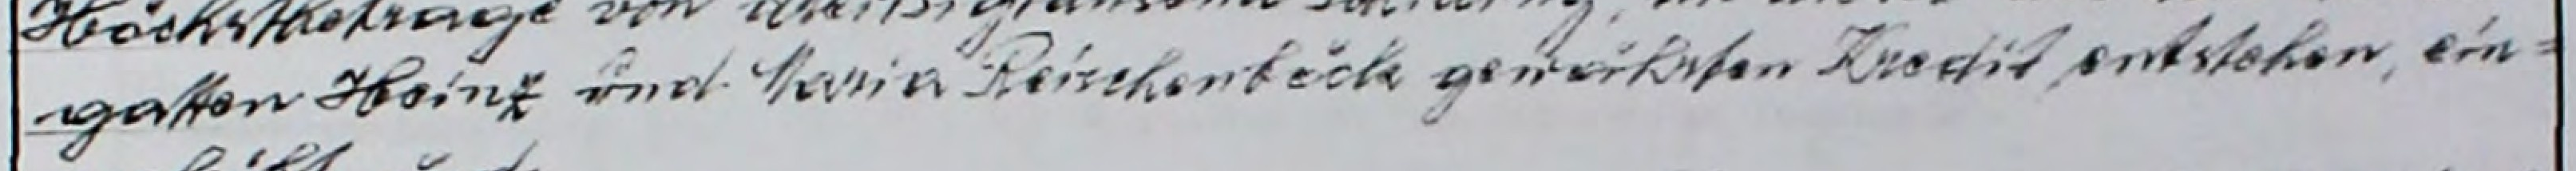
gasten Heinz und Maria Reischenböck gewährten Kredit entstehen, ein=
